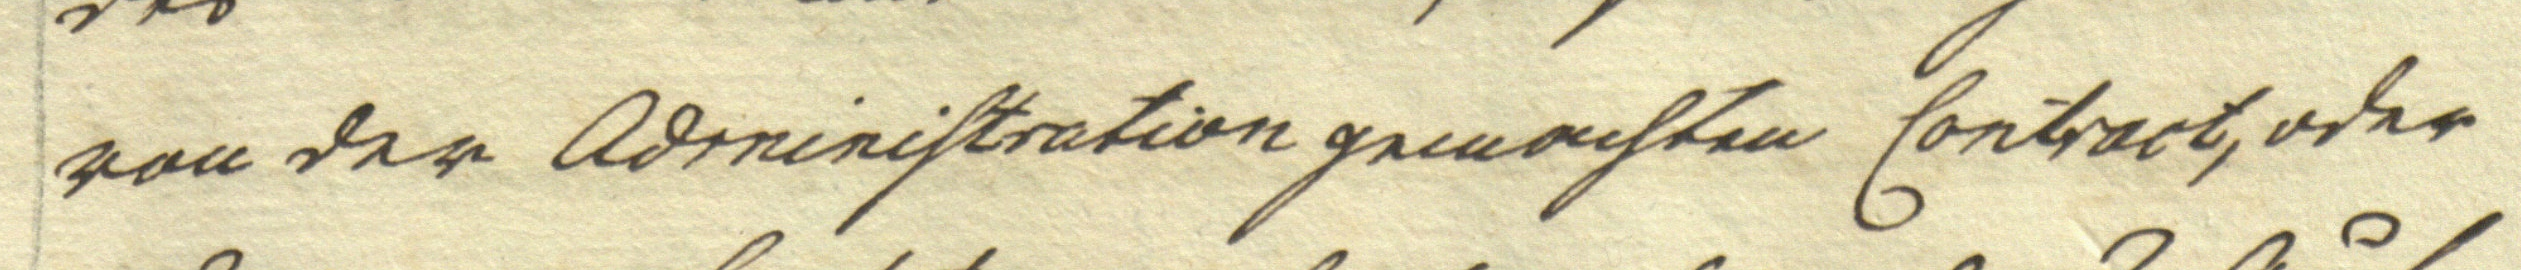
von der Administration gemachten Contract, oder
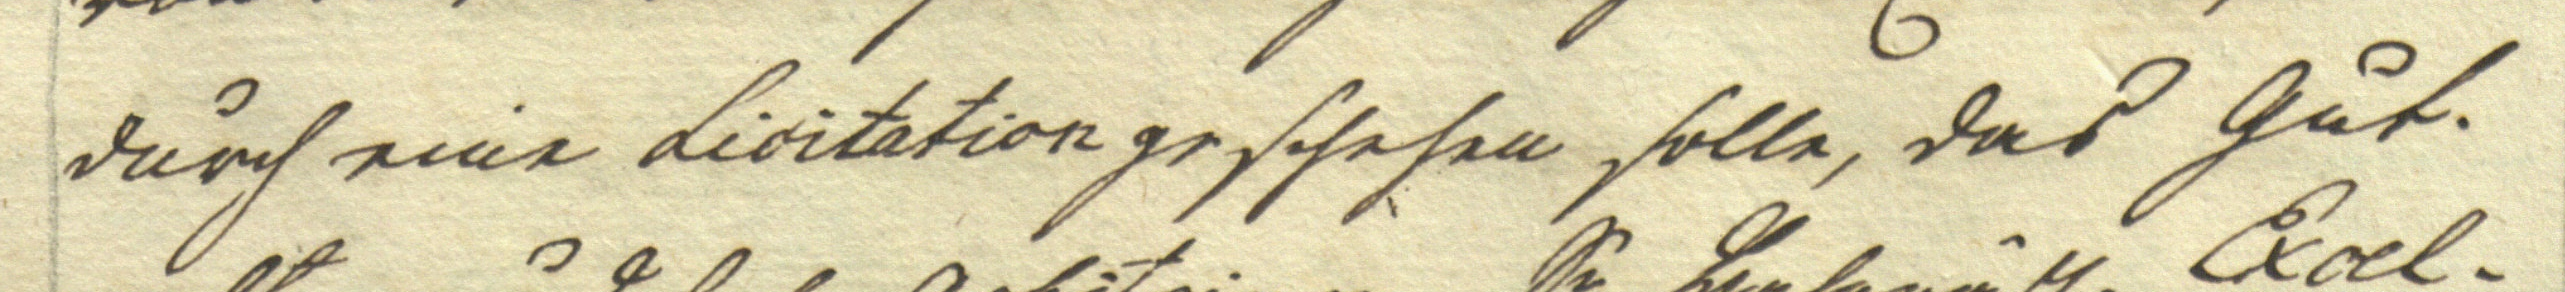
durch eine Licitation geschehen solle, das Gut¬
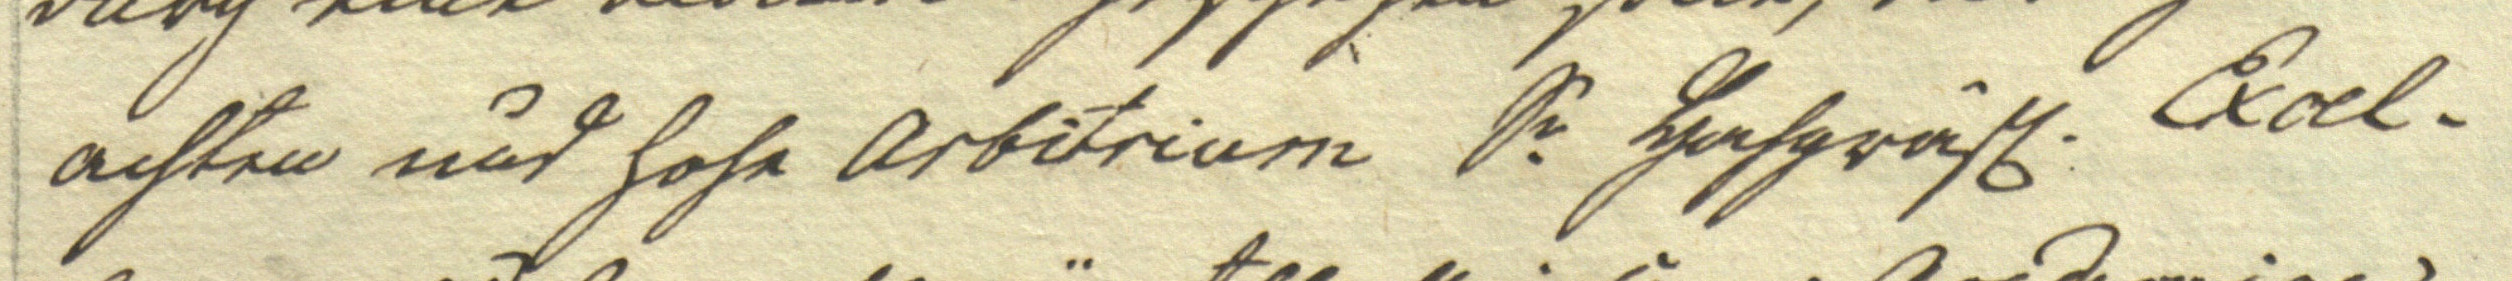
achten und hohe Arbitrium Sr Hochgräfl. Excel¬
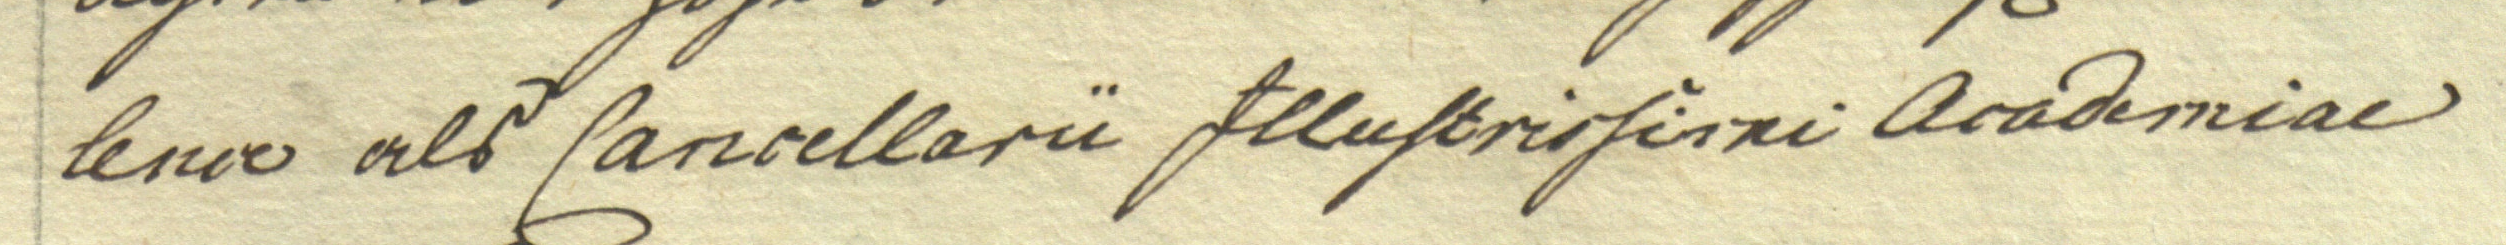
lence als Cancellarii Illustrissimi Academiae
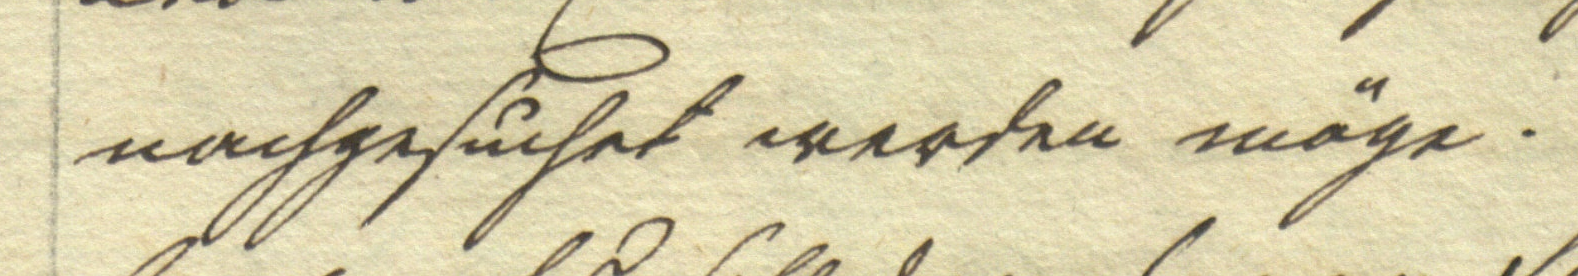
nachgesuchet werden möge.
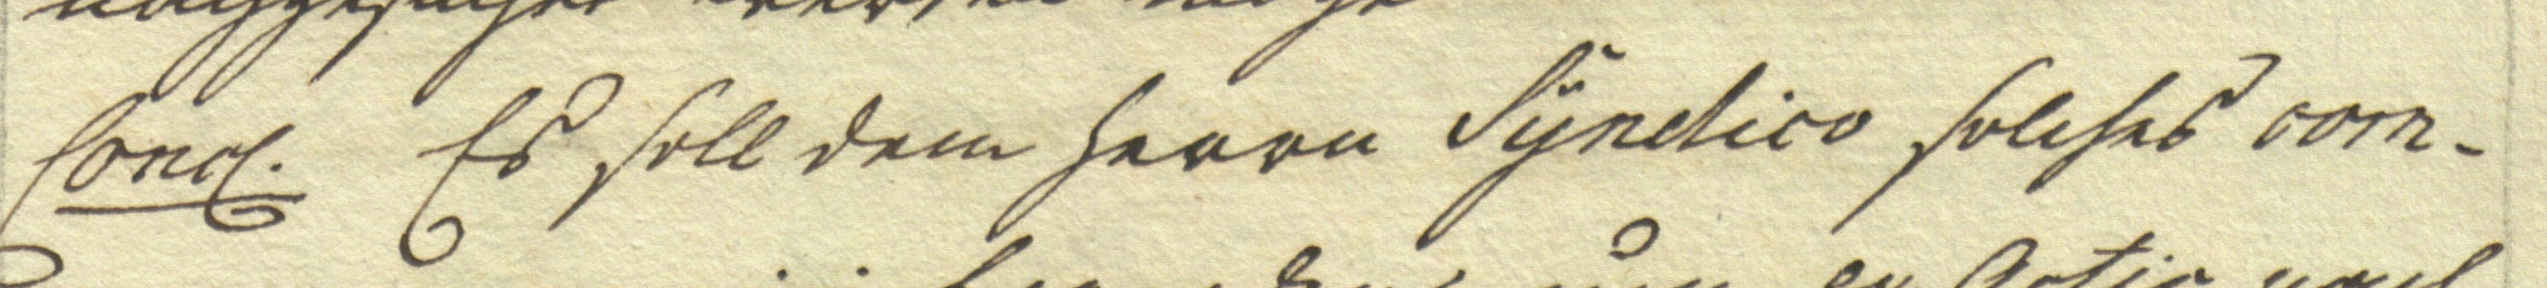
Concl. Es soll dem Herrn Sÿndico solches com¬
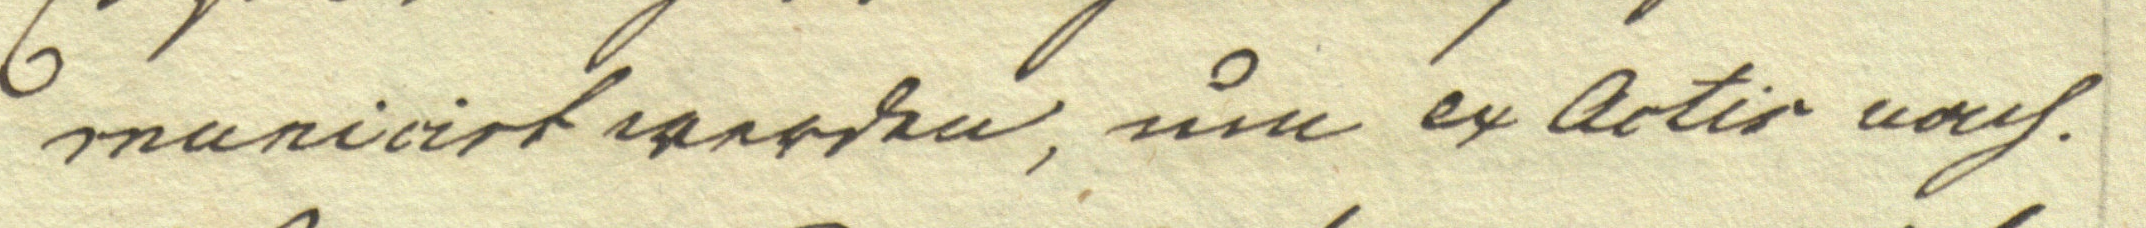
municirt werden, um ex Actis nach¬
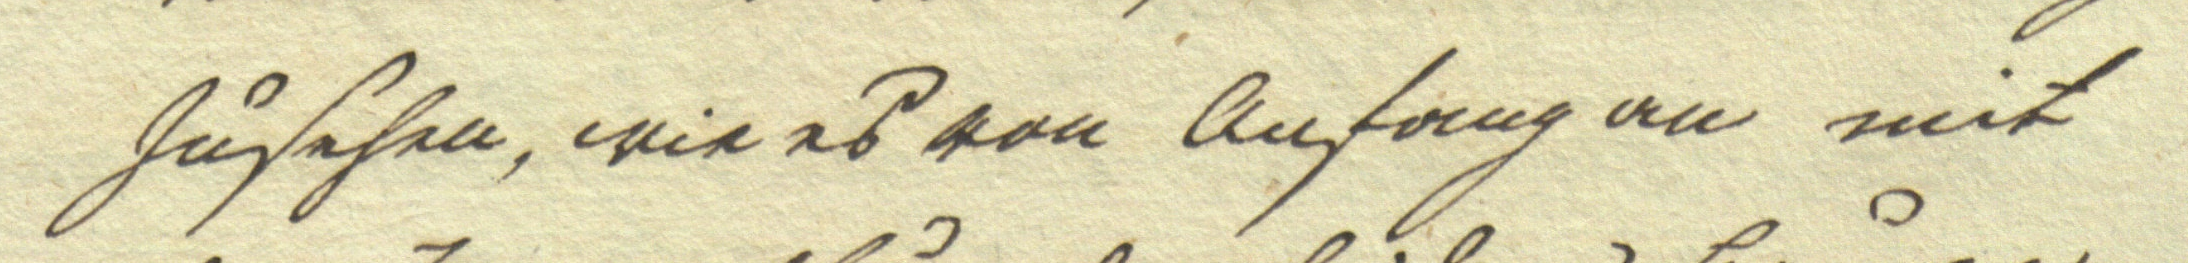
zusehen, wie es von Anfang an mit
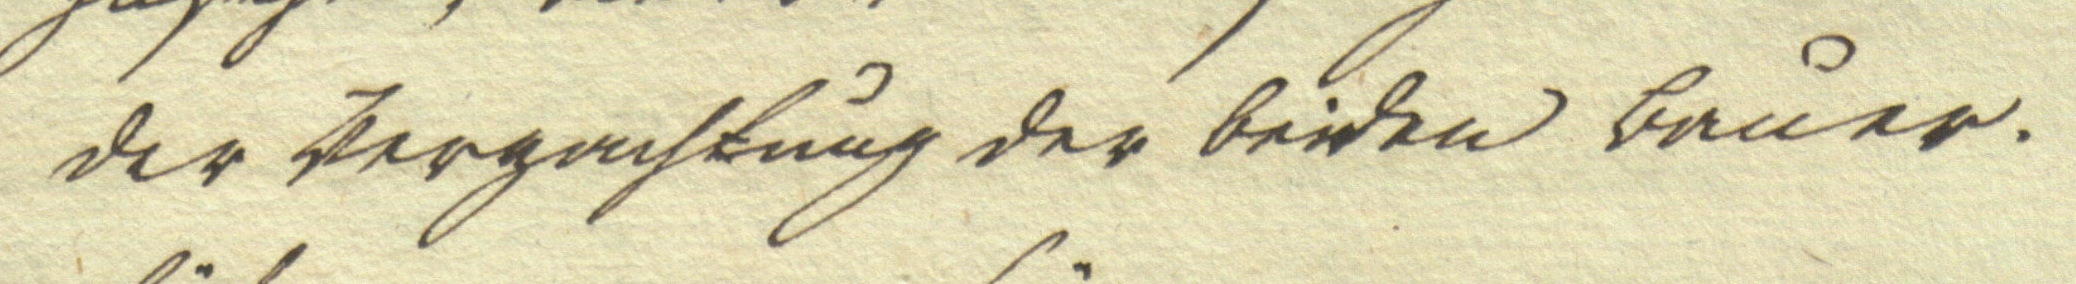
der Verpachtung der beiden Bauer¬
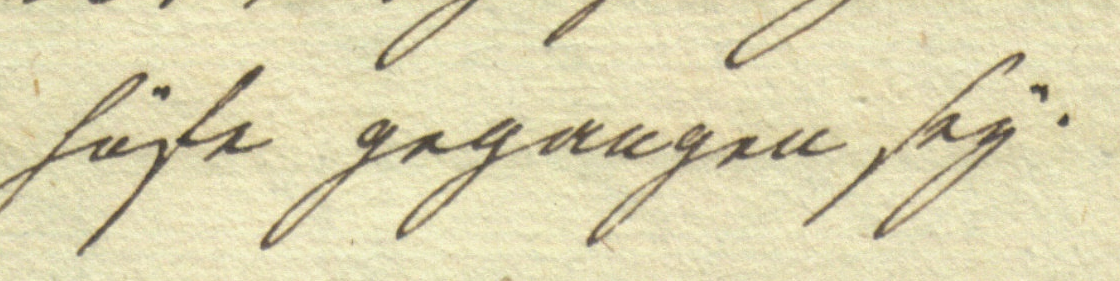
höfe gegangen seÿ.
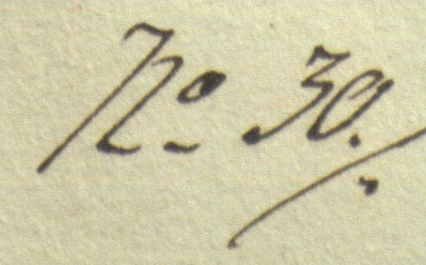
No 30.
